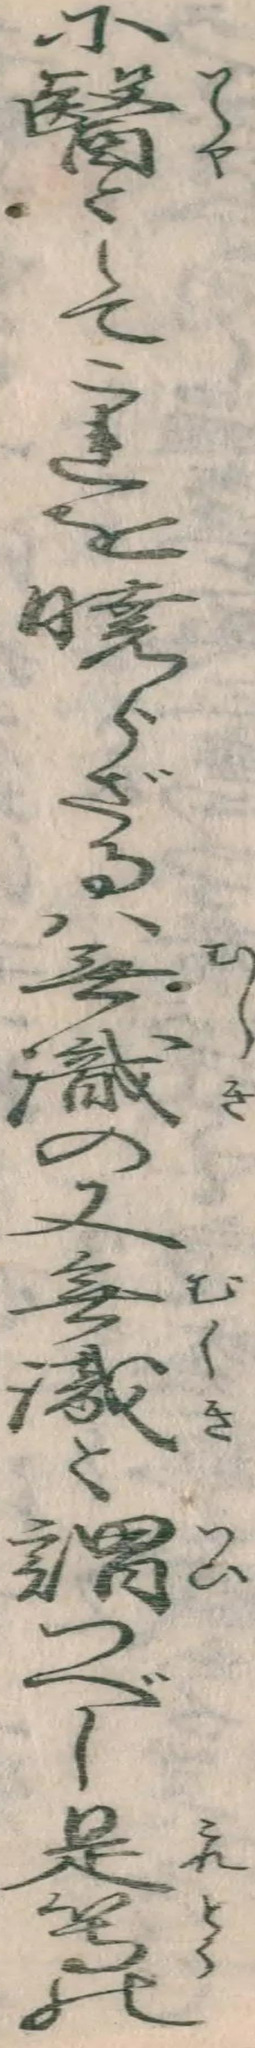に医としてこれを暁らざるは無識の又無識と謂つべし是等の
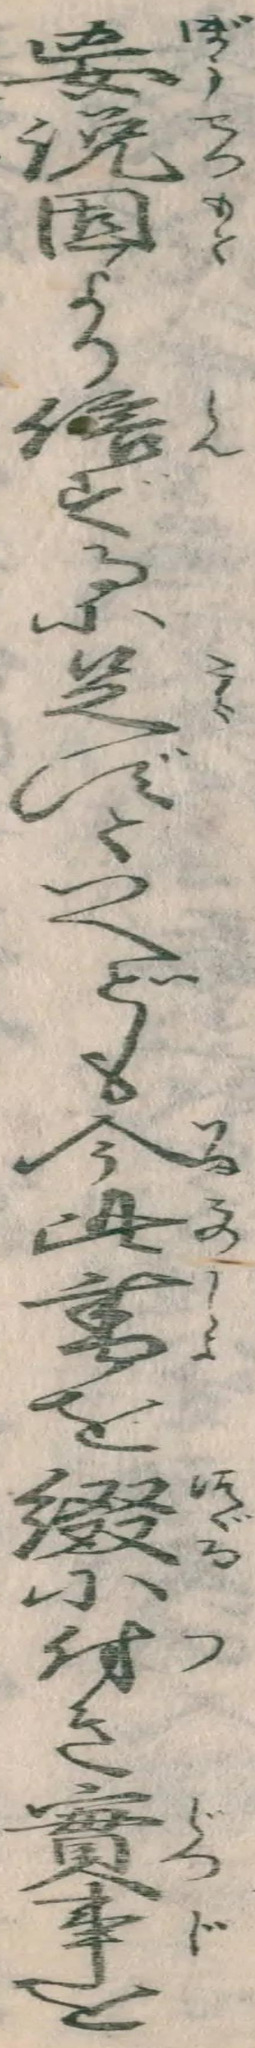妄悦固より信ずるに是ずといへども今此書を綴に付き実事を
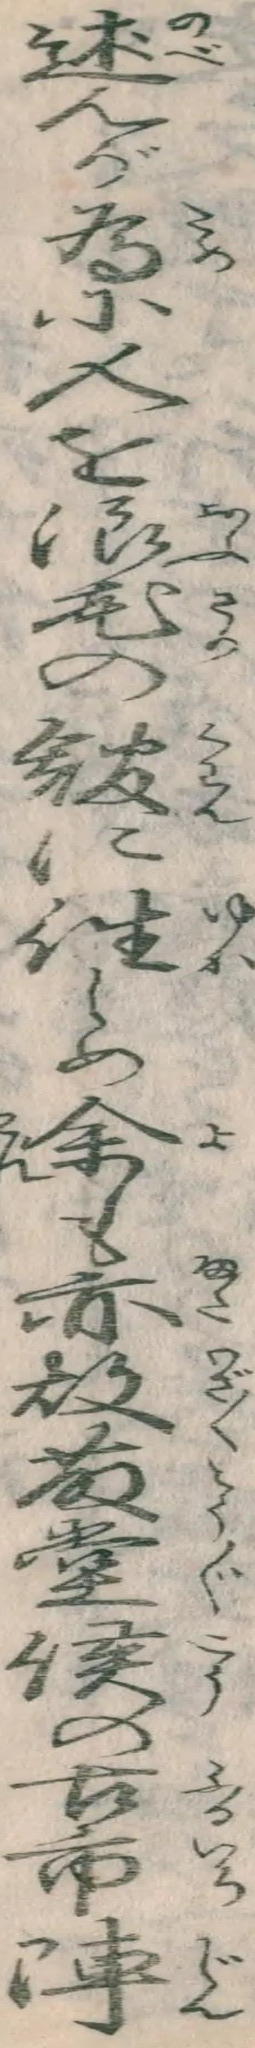述んが為に人を浪花の館に往しめ余も又故藤堂侯の古市陣
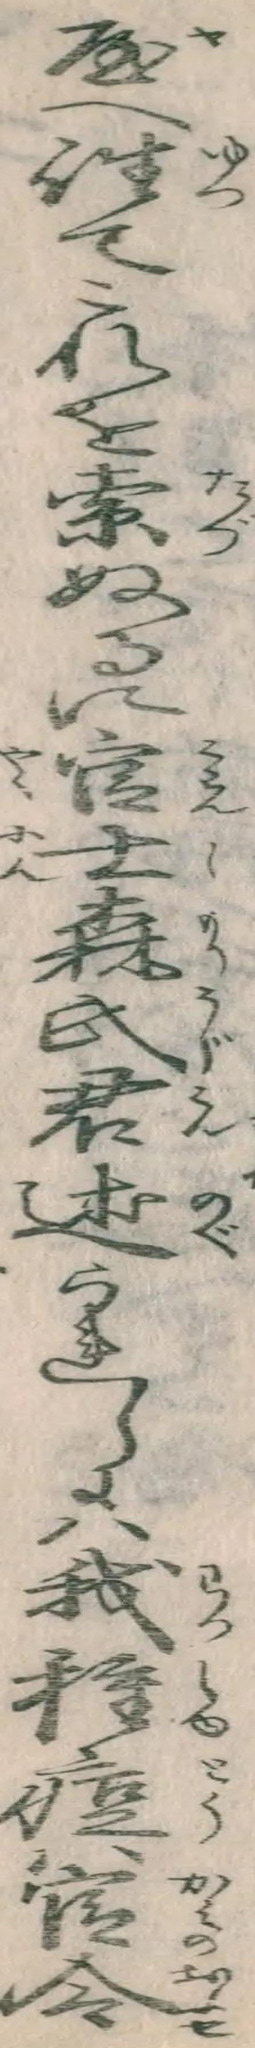屋往てこれを索ぬるに官士森氏君述られしには我種痘は官令
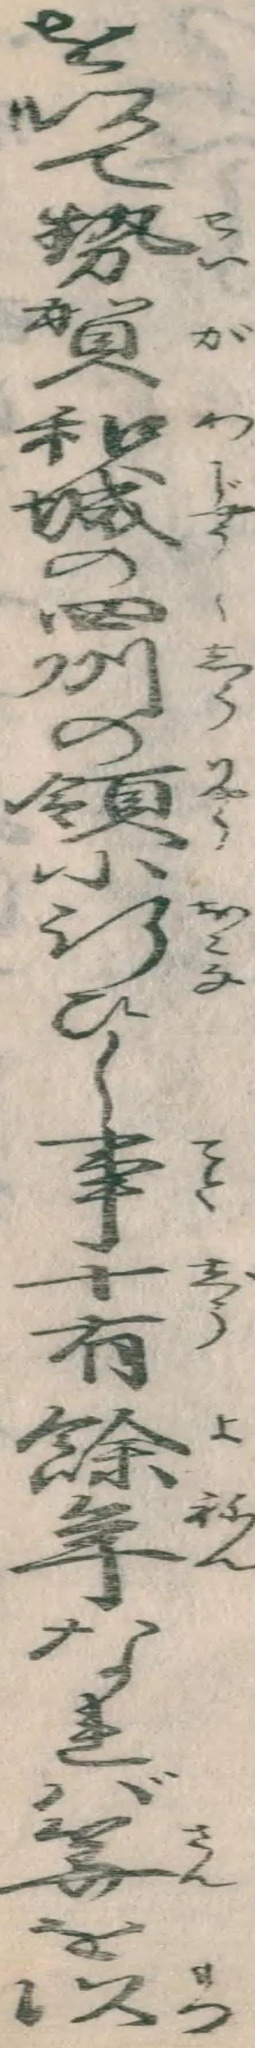を以て勢賀和城の四州の領に行ひし事十有余年なれば算を以
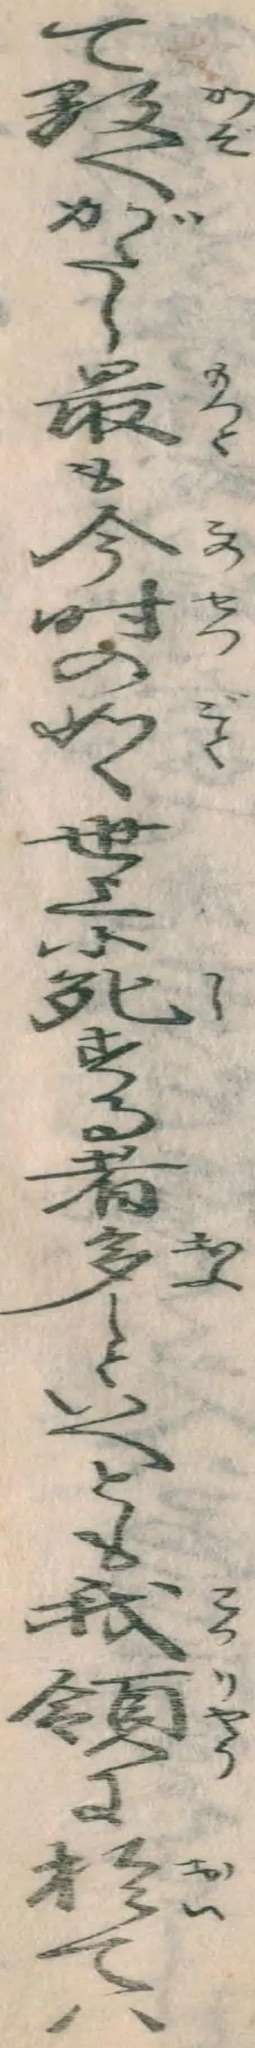て数へがたし最も今時の如く世上に死する者多しといへとも我領に於ては
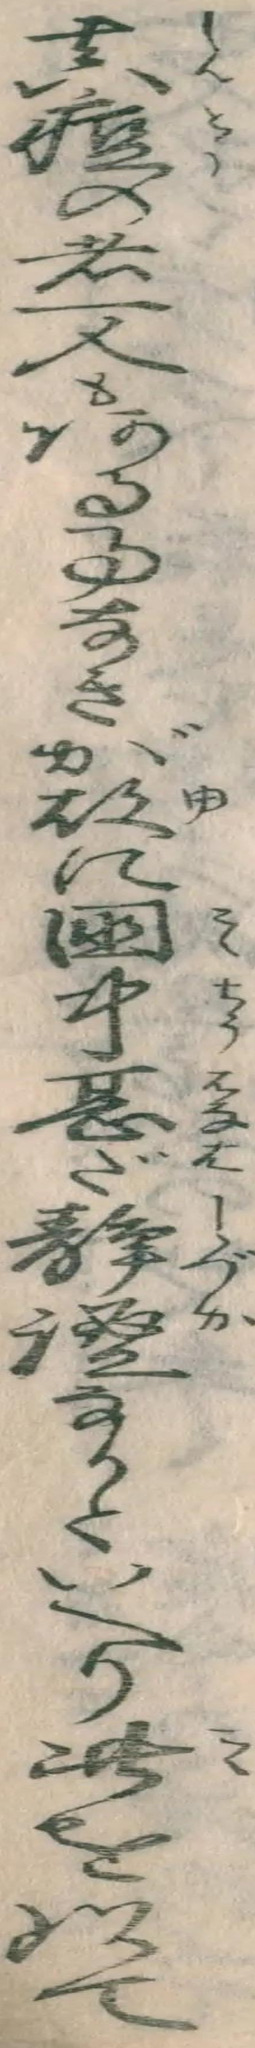真痘の者一人もある事なきが故に国中甚だ静証なりといへり此を以て

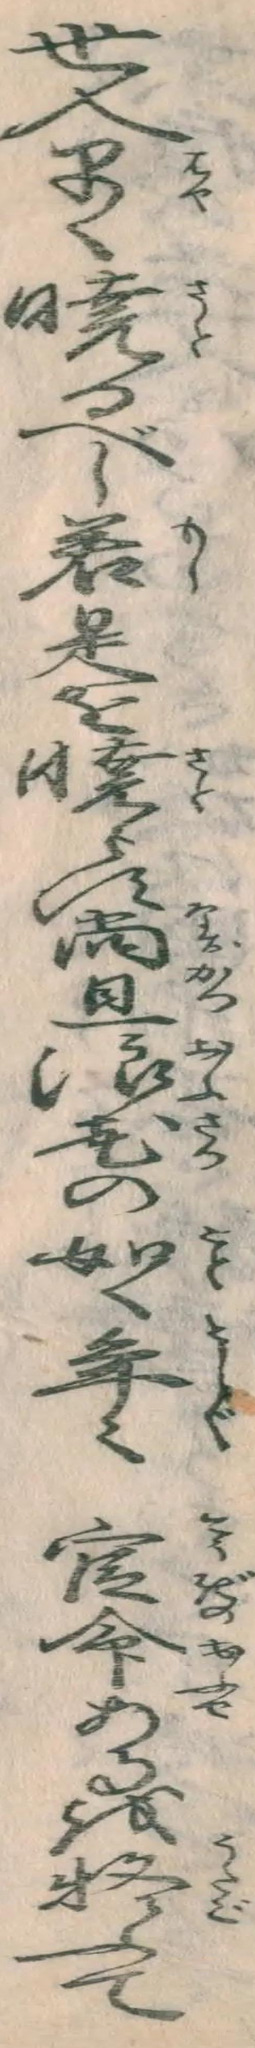世人早く暁るべし若是を暁らず尚且浪花の如く年々官命あるをふて
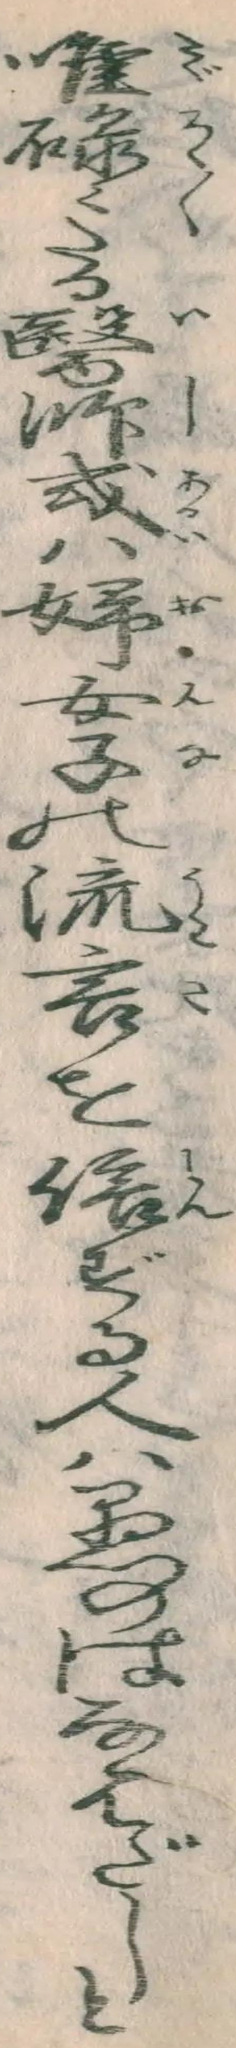唯碌々たる医師或は婦女子の流言を信ずる人は愚のはなはだしと
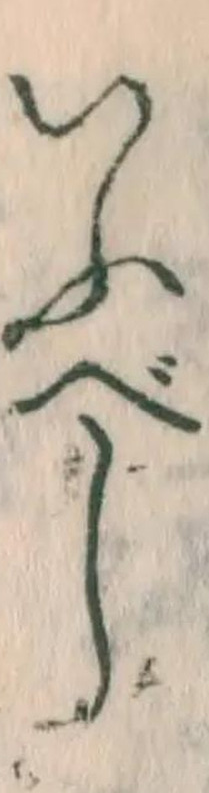いふべし
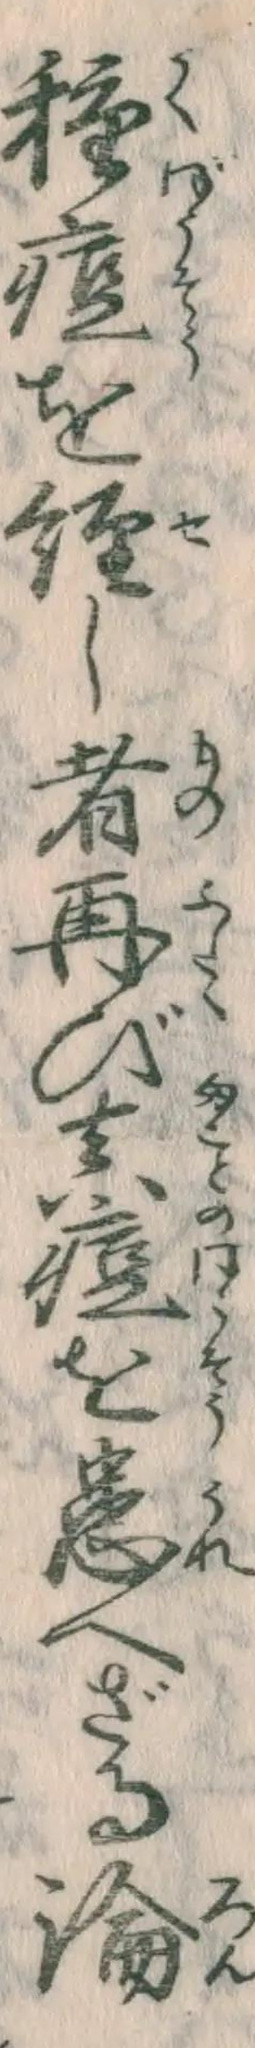種痘を種し者再び真痘を患へざる論
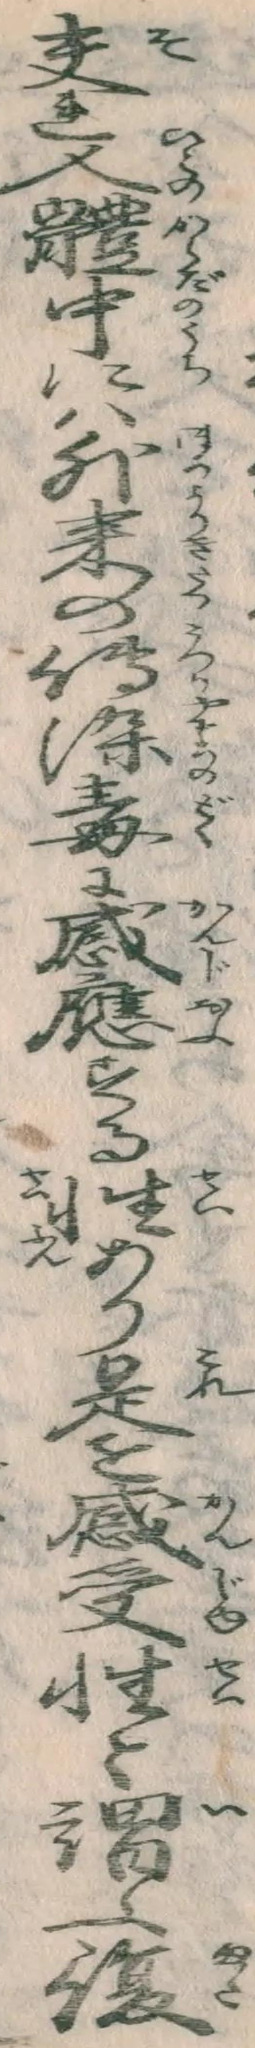夫れ人体中には外来の伝染毒に感応する性あり是を感受性と謂ふ復
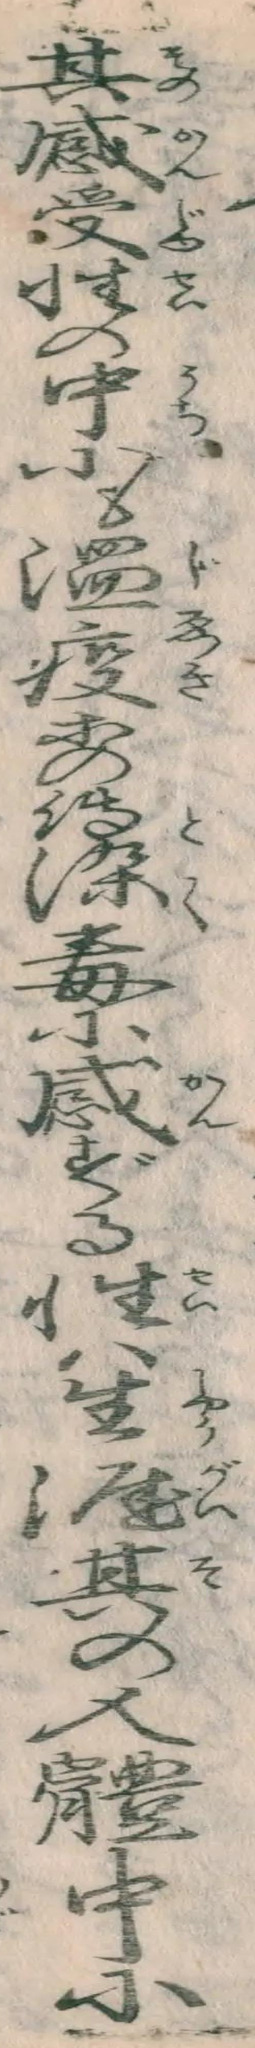其感受性の中にも温疫にの伝染毒に感ずる性は生涯其の人体中に
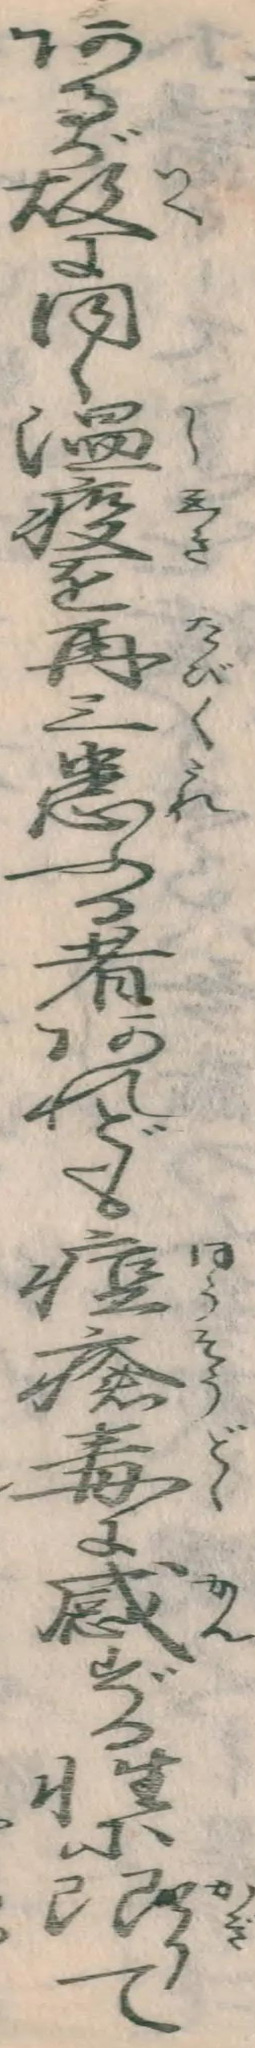あるが故に同く温疫を再三患ふる者あれども痘瘡毒に感ずる性に限りて
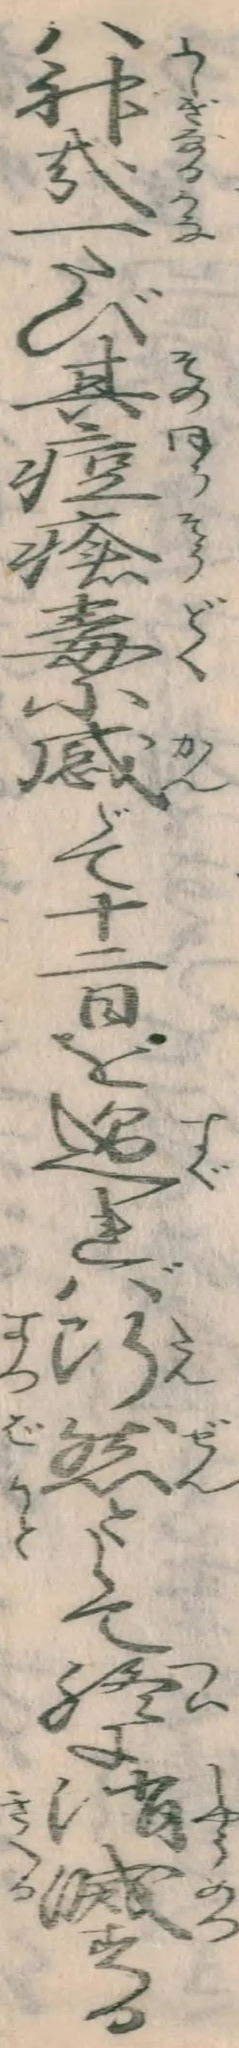は神哉一たび其痘瘡毒に感じて十二日を過れば断然として終に消滅する
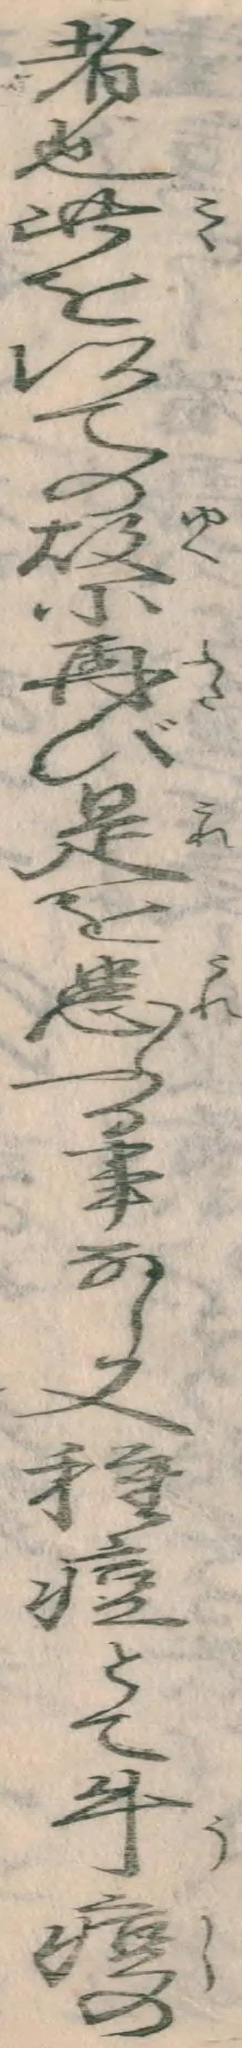者也此を以ての故に再び是を患ふる事なし又種痘とて牛痘の
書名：種痘辨
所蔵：国立国会図書館 National Diet Library, JAPAN
